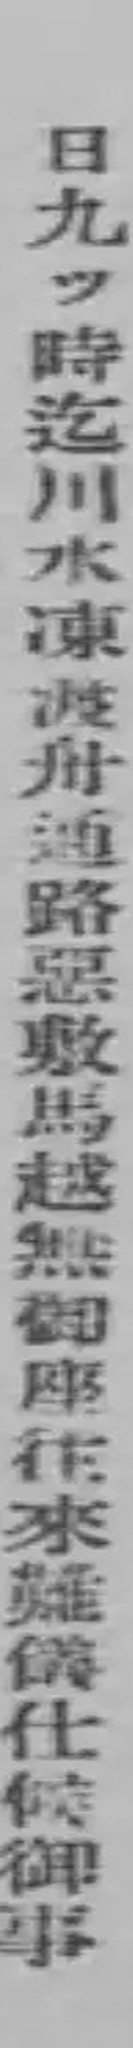日九ツ時迄川水凍渡舟通路悪敷馬越無御座往来難儀仕候御事
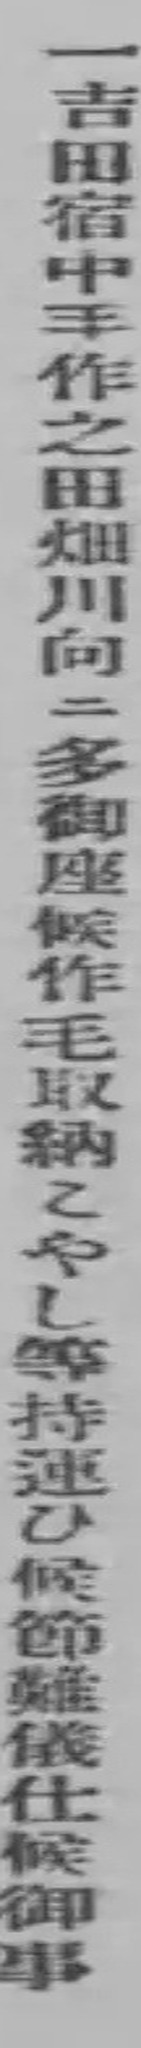一吉田宿中手作之田畑川向ニ多御座候作毛取納こやし等持運ひ候節難儀仕候御事
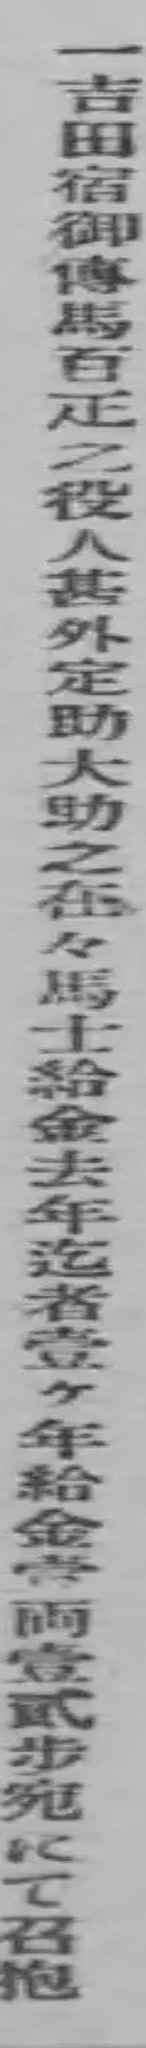一吉田宿御伝馬百疋之役人甚外定助大助之在々馬士給金去年迄者壱ケ年給金壱両壱弐歩宛にて召抱
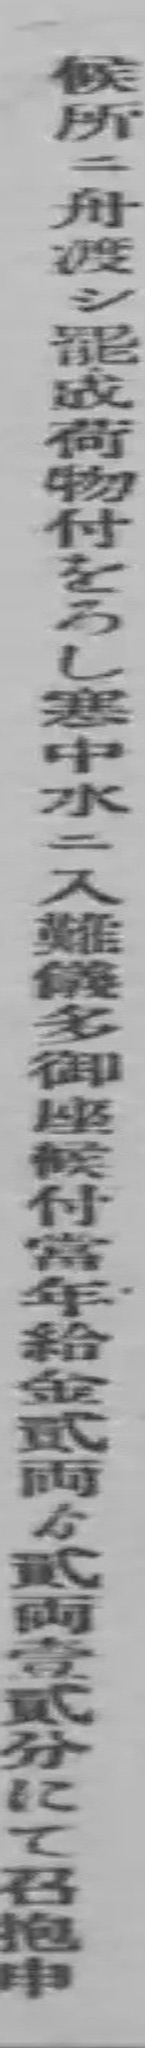候所ニ舟渡シ罷成荷物付をろし寒中水ニ入難儀多御座候付当年給金弐両ゟ弐両壱弐分にて召抱申
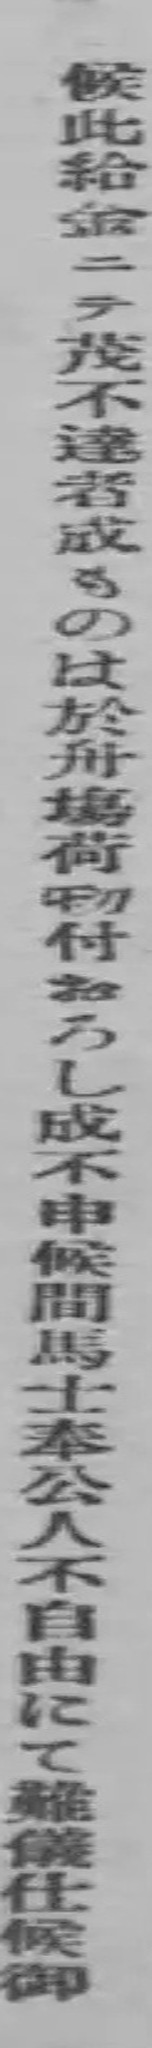候此給金ニテ茂不達者成ものは於舟場荷物付おろし成不申候間馬士奉公人不自由にて難儀仕候御
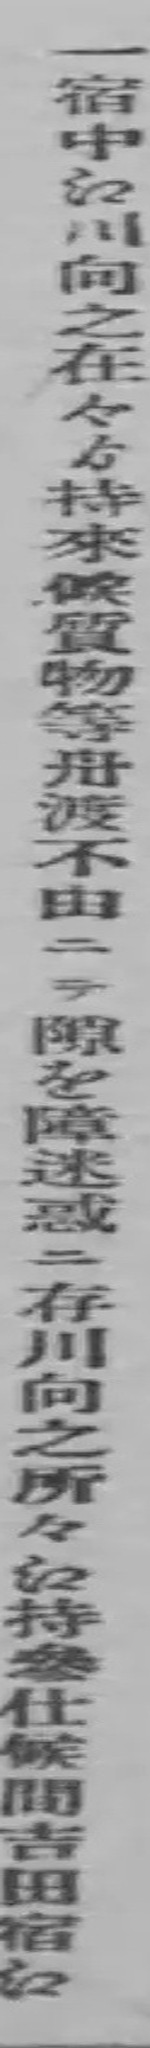一宿中え川向之在々ゟ持来候質物等舟渡不由ニテ隙を障迷惑ニ存川向之所々え持参仕候間吉田宿え
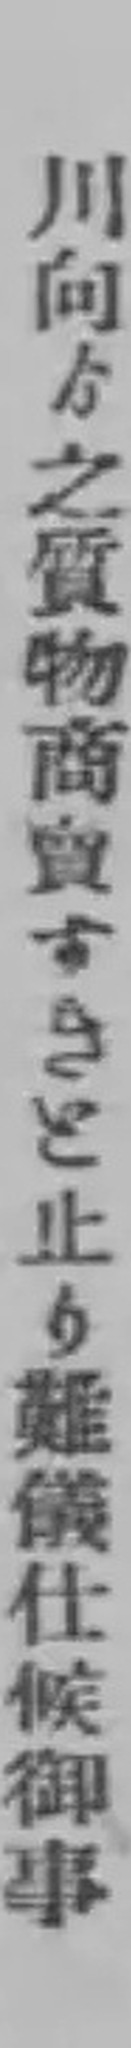川向ゟ之質物商売すきと止り難儀仕候御事
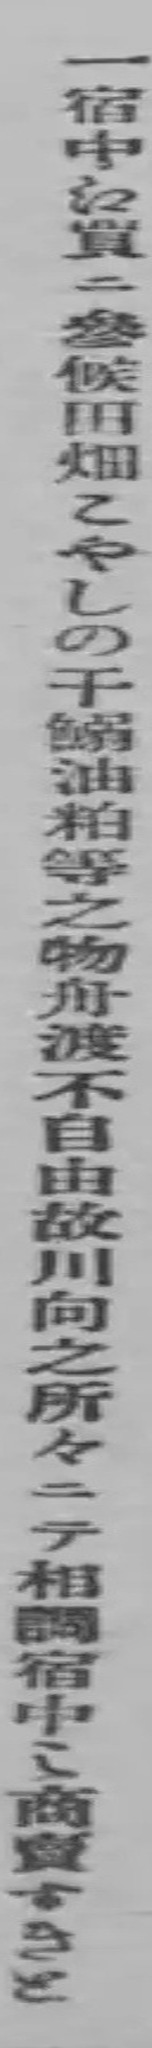一宿中え買ニ参候田畑こやしの干鰯油粕等之物舟渡不自由故川向之所々ニテ相調宿中之商売すきと
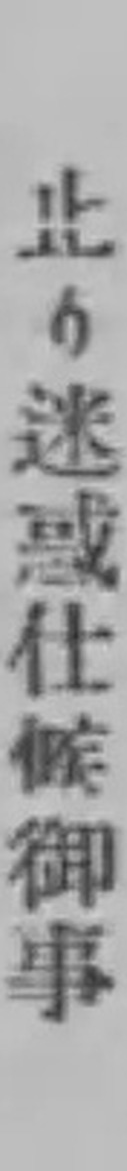止り迷惑仕候御事
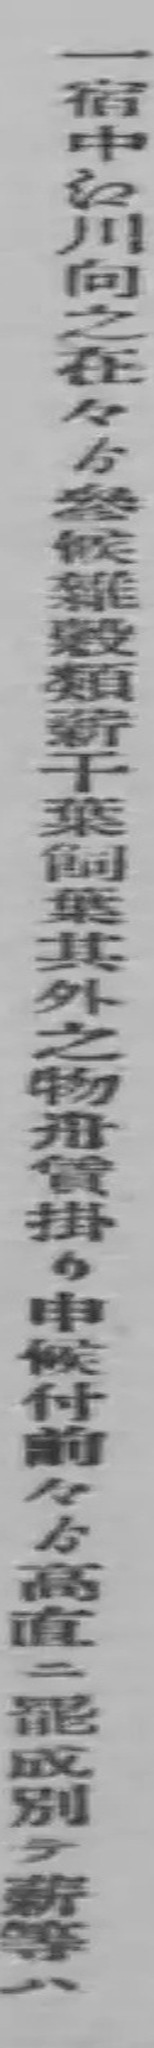一宿中え川向之在々ゟ参候雑穀類薪干葉飼葉其外之物舟賃掛り申候付前々ゟ高直ニ罷成別テ薪等ハ
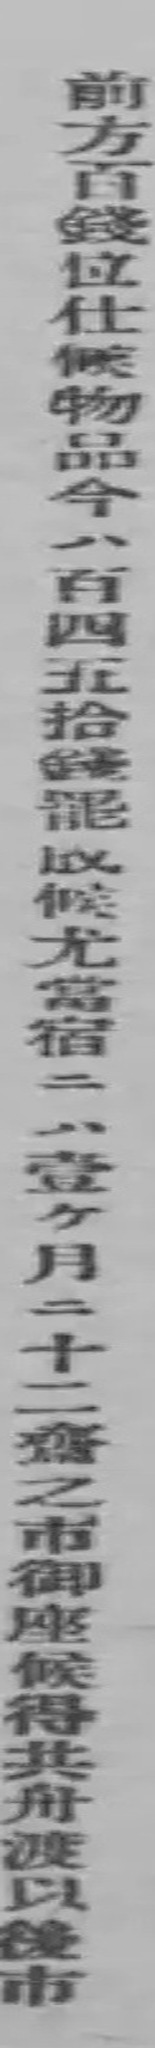前方百銭位仕候物品今ハ百四五拾銭罷成候尤当宿ニハ壱ケ月ニ十二斉之市御座候得共舟渡以後市
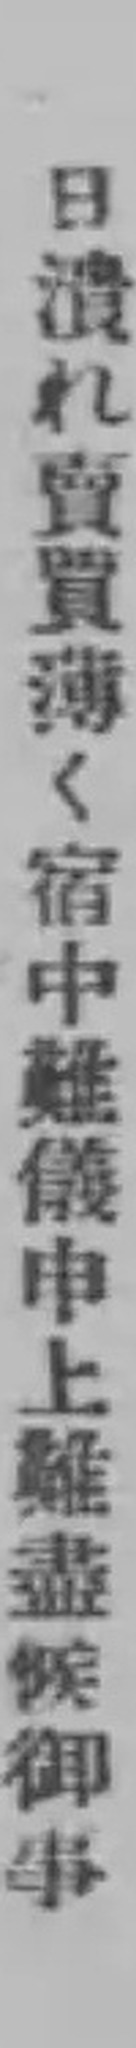日潰れ売買薄く宿中難儀申上難尽候御事
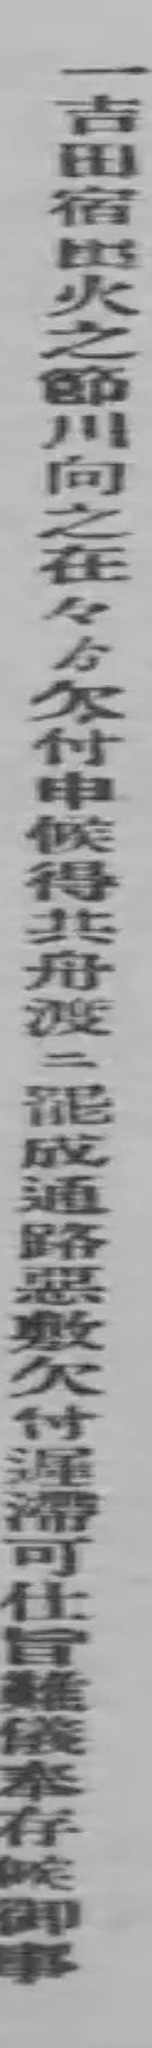一吉田宿出火之節川向之在々ゟ欠付申候得共舟渡ニ罷成通路悪敷欠付遅滞可仕旨難儀奉存候御事
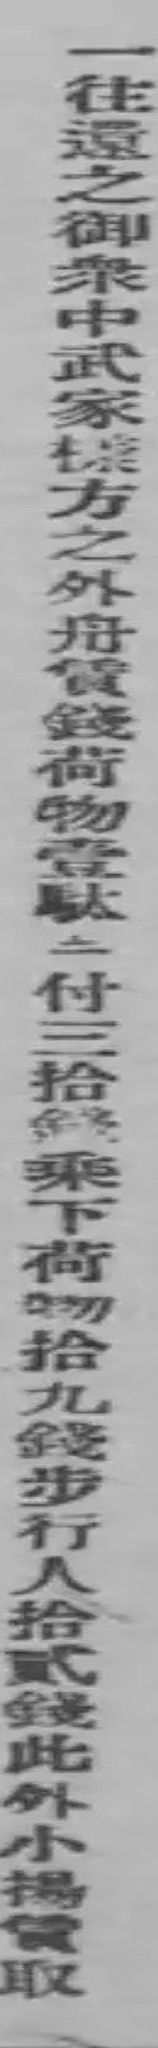一往還之御衆中武家様方之外舟賃銭荷物壱駄ニ付三拾銭乗下荷物拾九銭歩行人拾弐銭此外小揚賃取
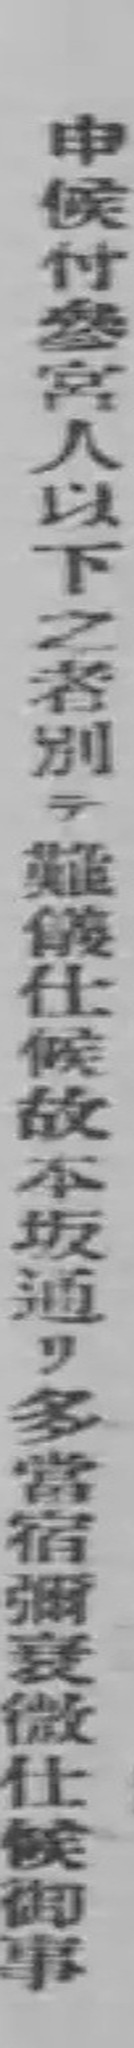申候付参宮人以下之者別テ難儀仕候故本坂通り多当宿弥衰微仕候御事
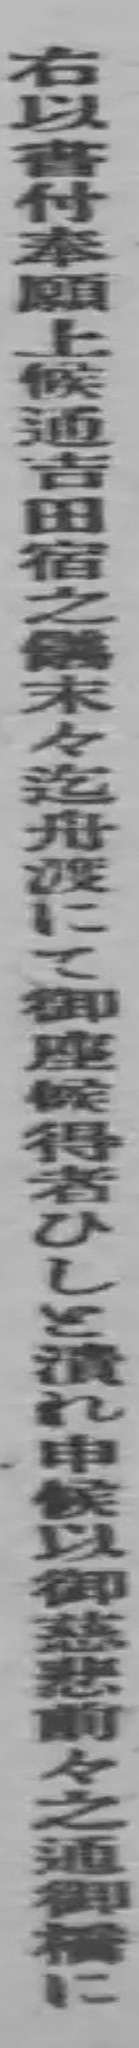右以書付奉願上候通吉田宿之儀末々迄舟渡にて御座候得者ひしと潰れ申候以御慈悲前々之通御橋に
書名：豊橋市史談
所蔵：国立国会図書館 National Diet Library, JAPAN
